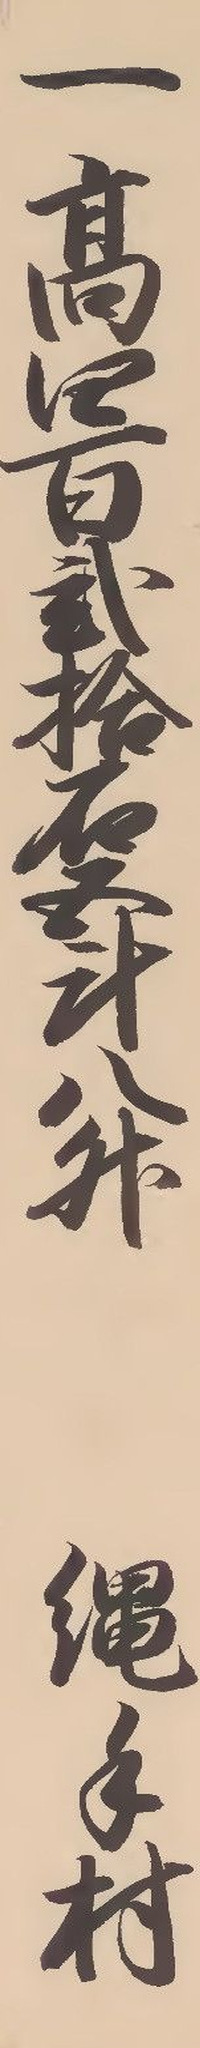一高四百弐拾石五斗八升縄手村
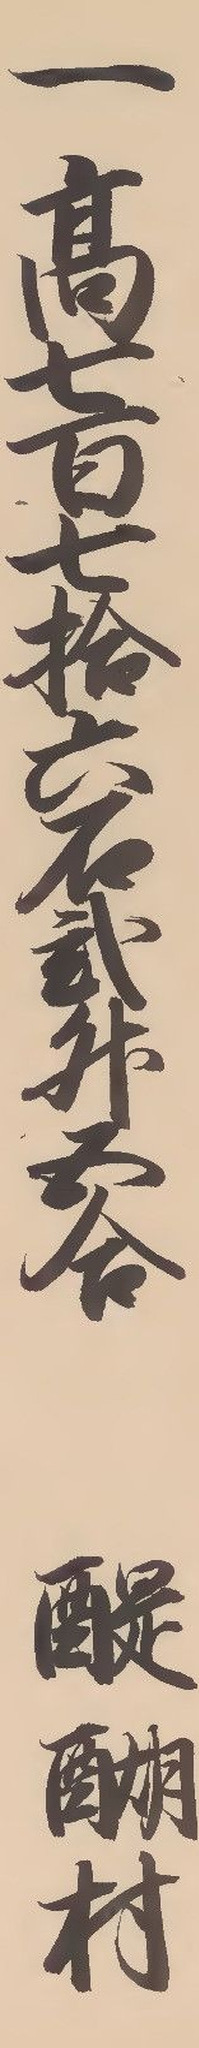一高七百七拾六石弐升五合醍醐村
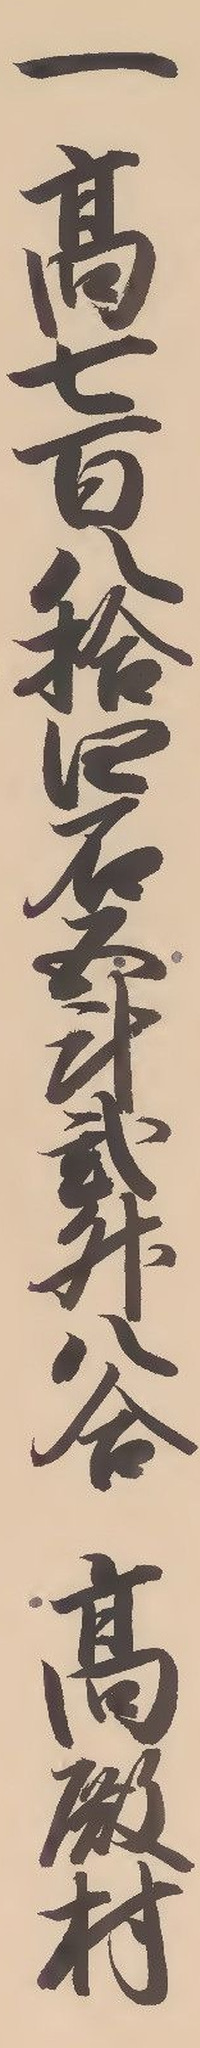一高七百八拾四石五斗弐升八合高殿村

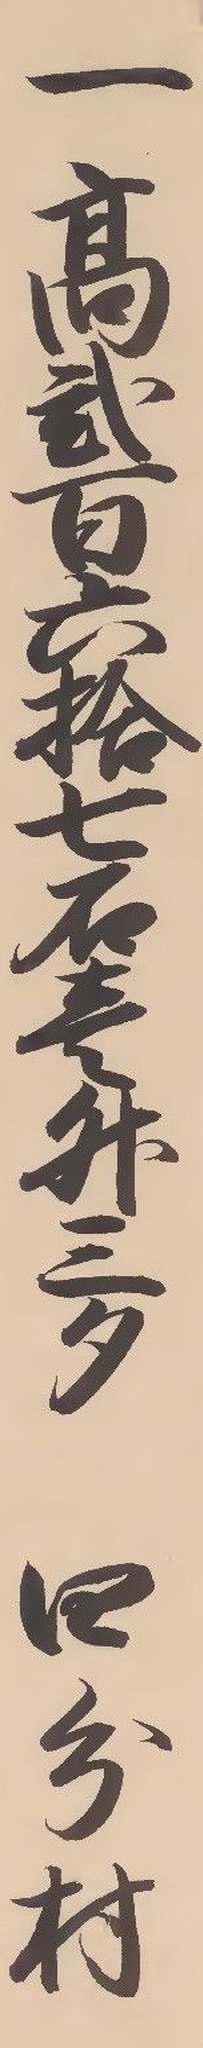一高弐百六拾七石壱升三勺四分村
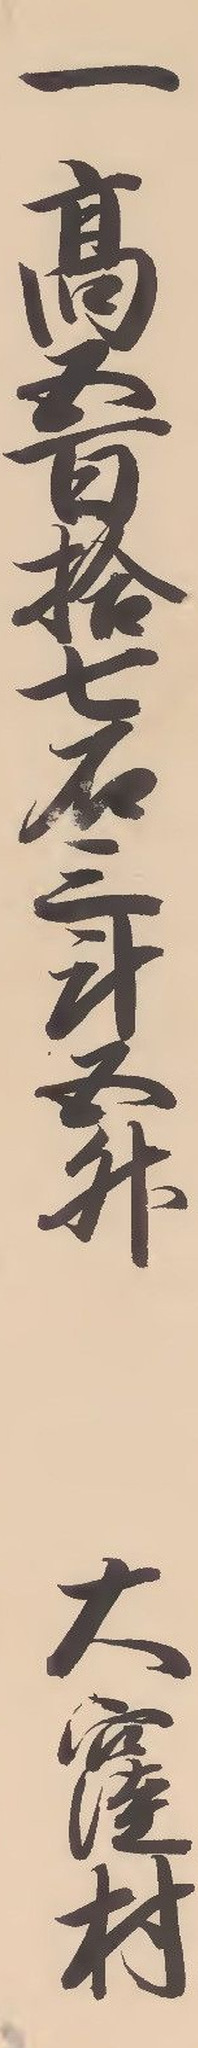一高五百拾七石三斗五升大窪村
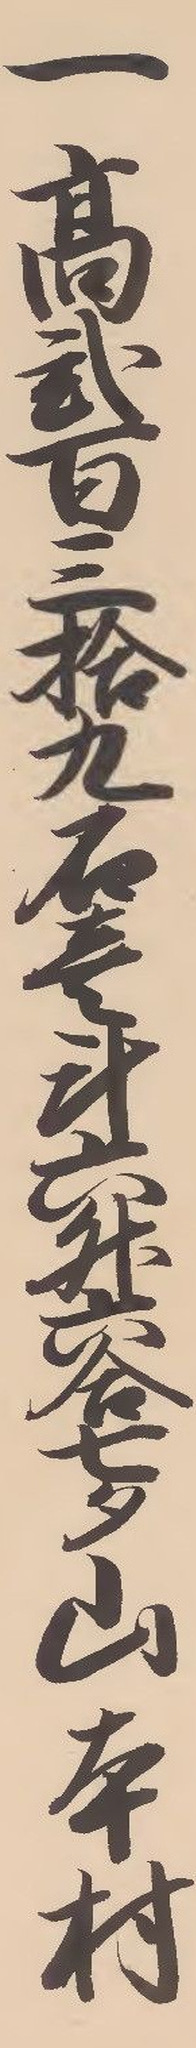一高弐百三拾九石壱斗六升六合七勺山本村
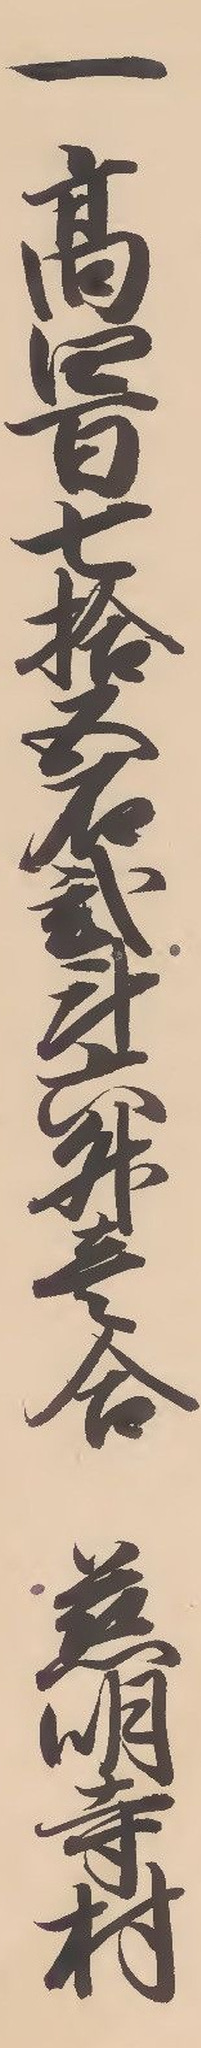一高四百七拾五石弐斗六升壱合慈明寺村

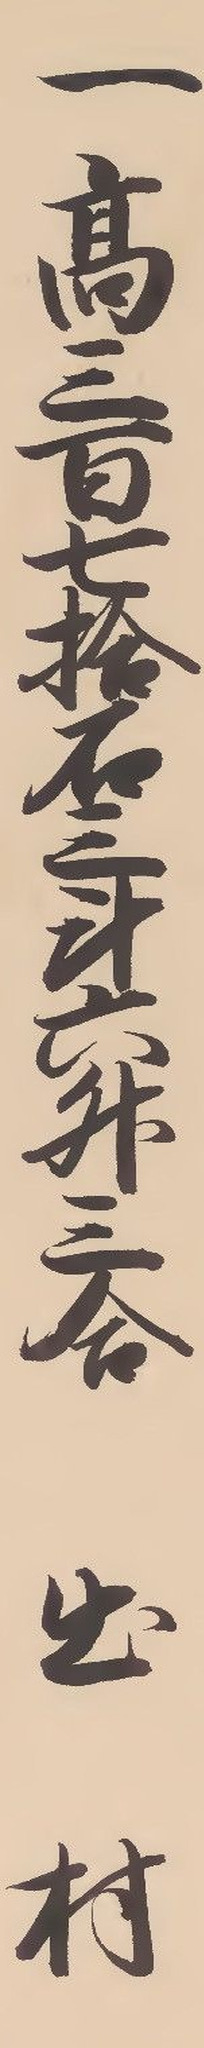一高三百七拾石三斗六升三合出村
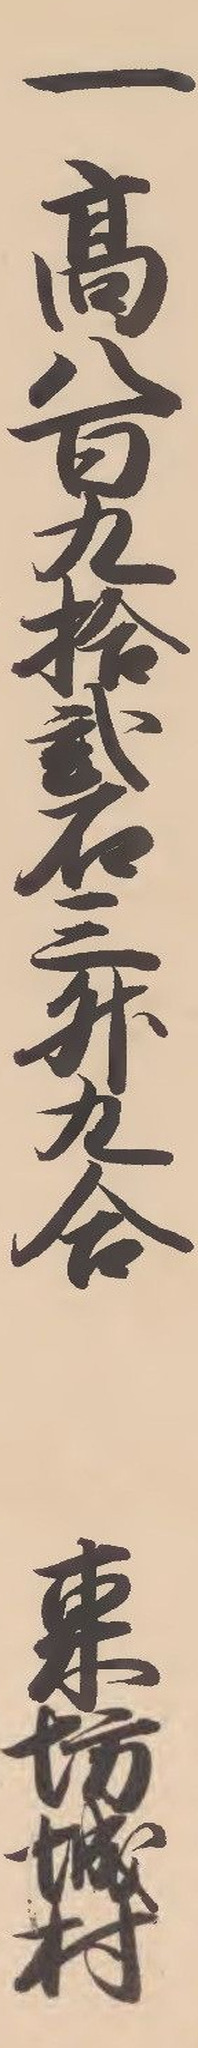一高八百九拾弐石三升九合東坊城村
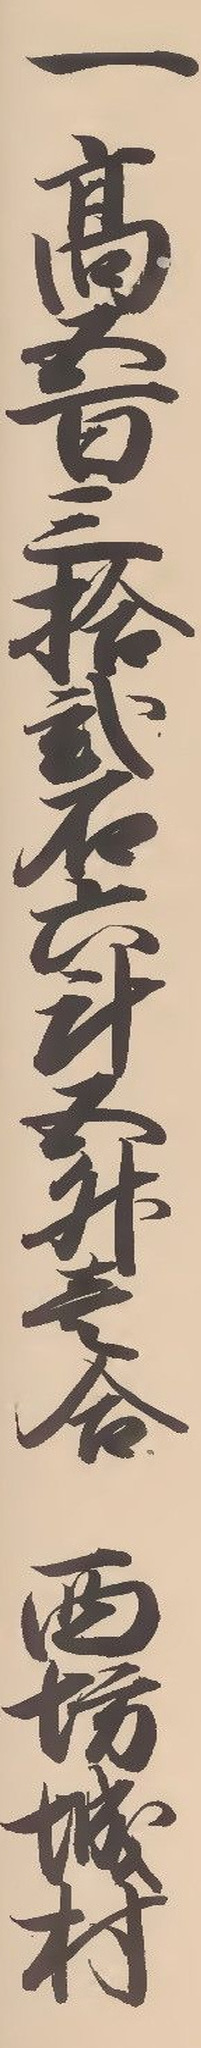一高五百三拾弐石六斗五升壱合西坊城村
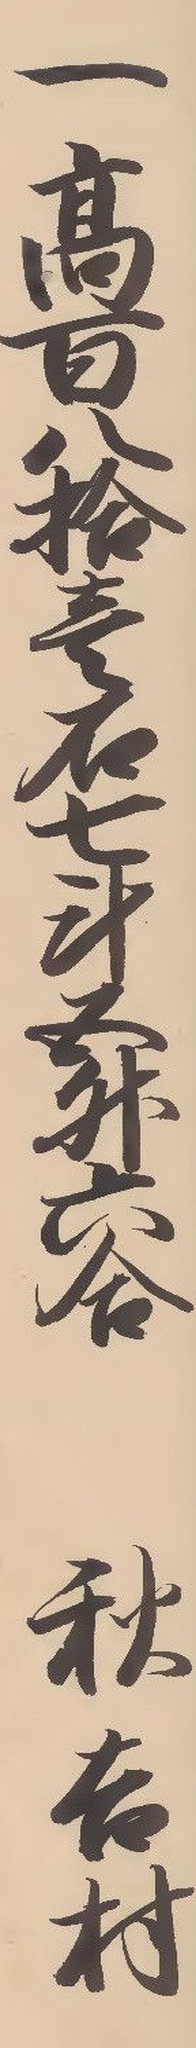一高百八拾壱石七斗五升六合秋吉村
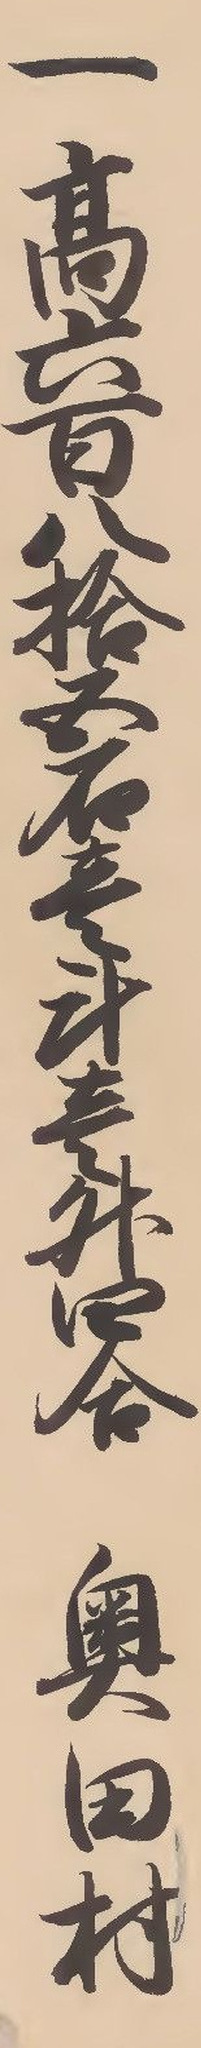一高六百八拾五石壱斗壱升四合奥田村
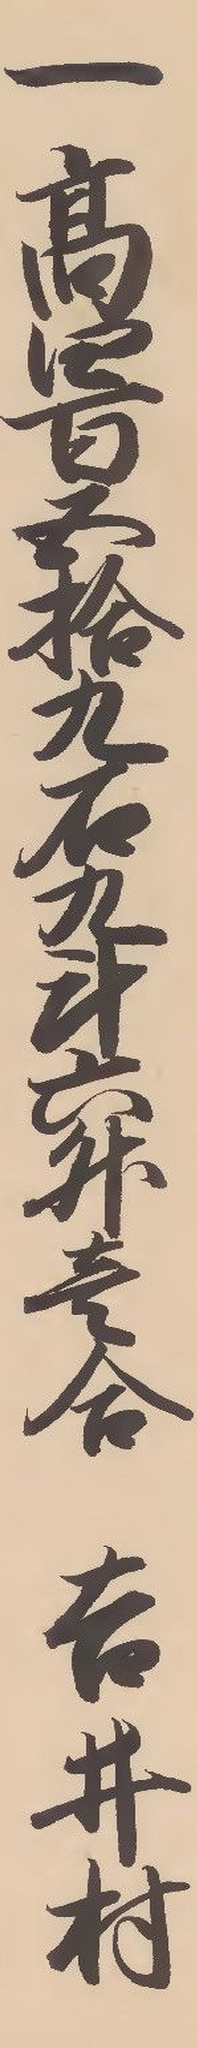一高四百五拾九石九斗六升壱合吉井村
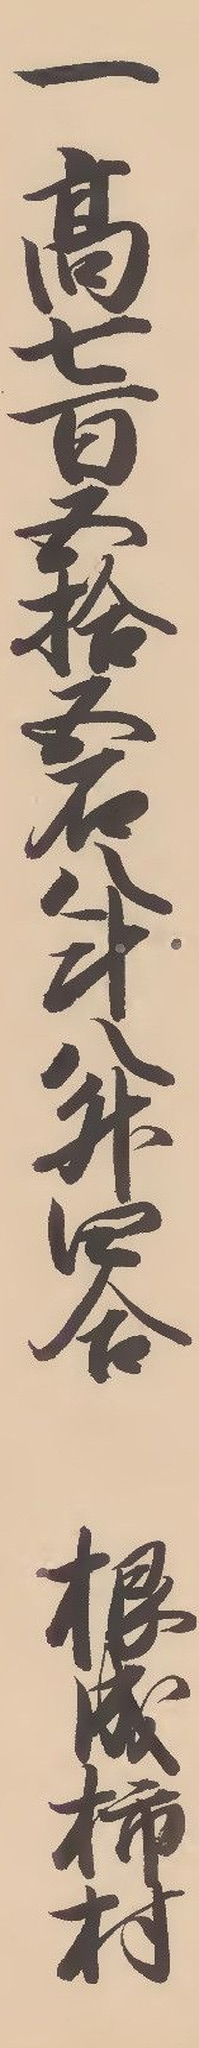一高七百五拾五石八斗八升四合根成柿村

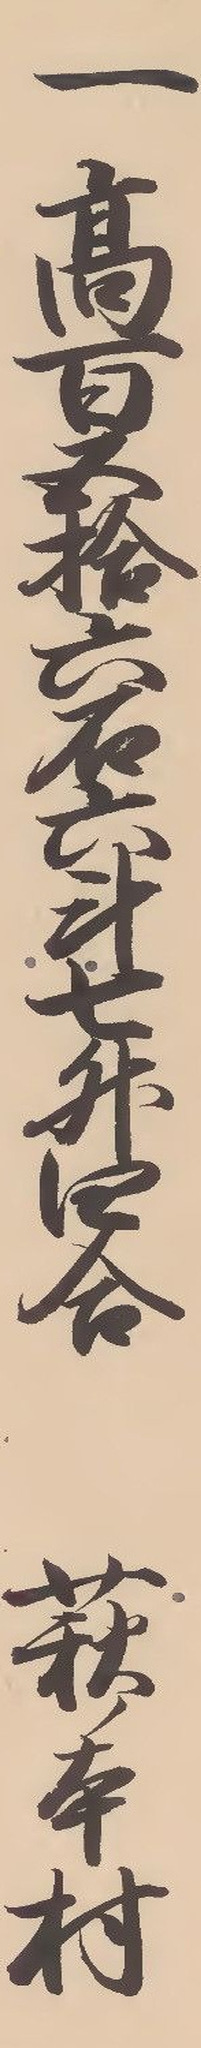一高百五拾六石六斗七升四合萩ノ本村
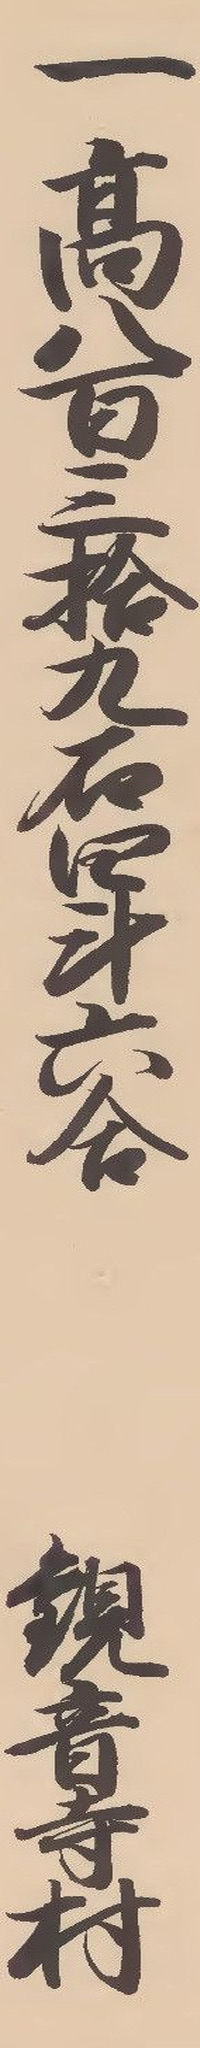一高八百三拾九石四斗六合観音寺村
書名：大和国郷帳
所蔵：国立公文書館 National Archives of Japan
